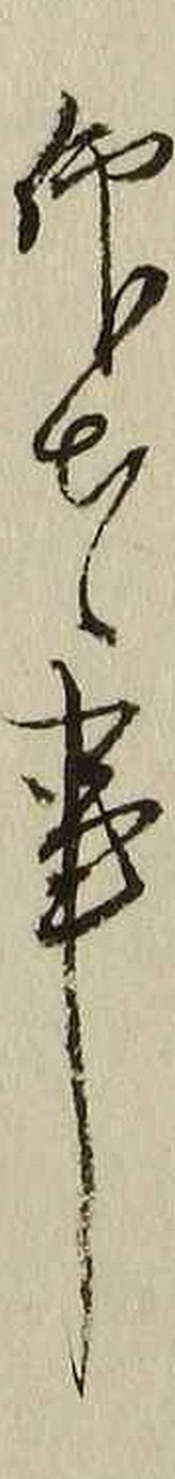仰付候事
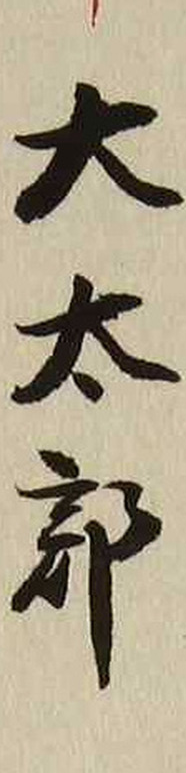大太郎
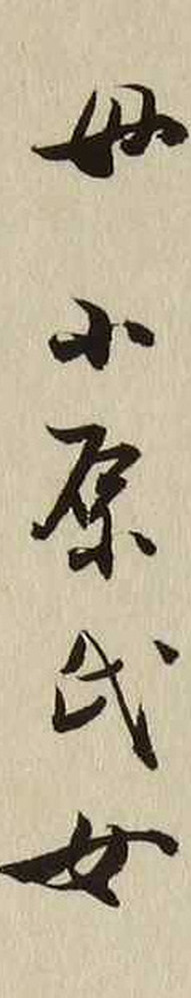母小原氏女

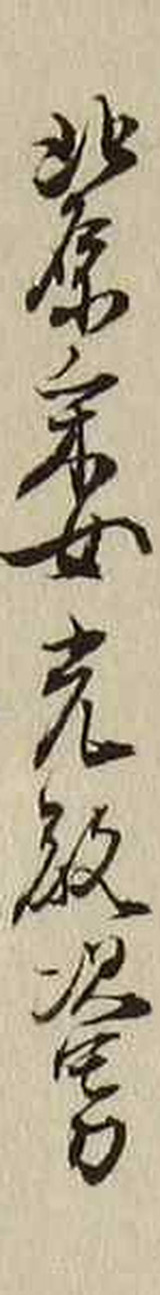北原采女光敬次男
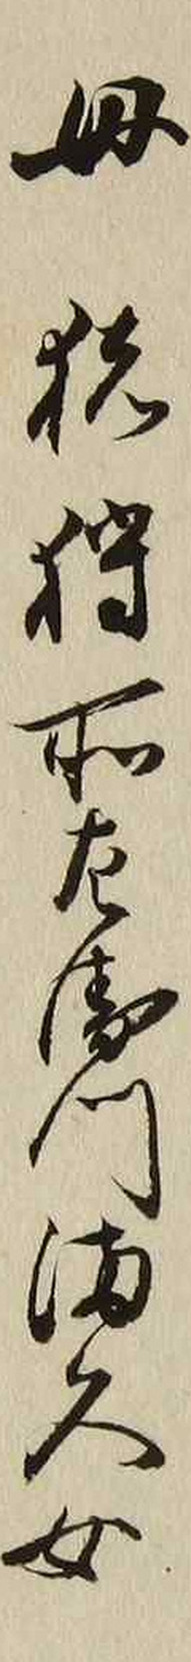母猪狩所左衛門満久女
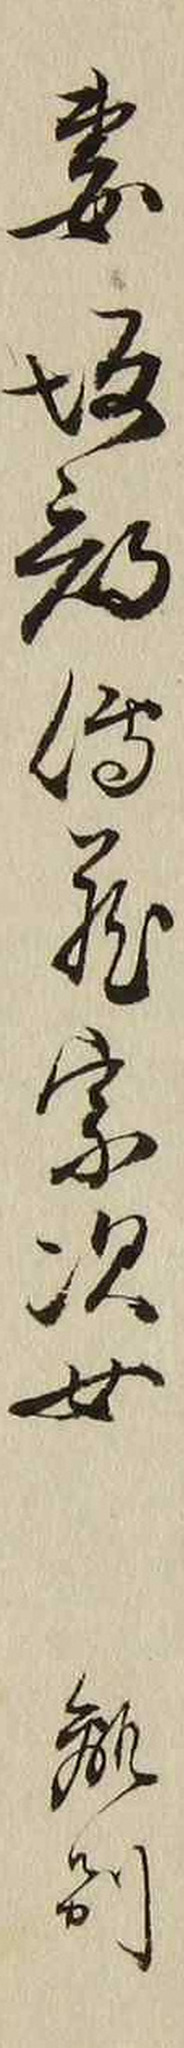妻坂部伝蔵宗次女離別
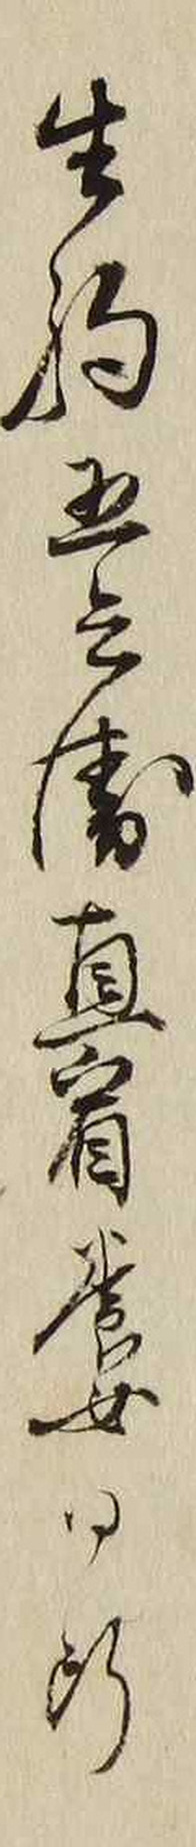生駒五兵衛直宥養女同断
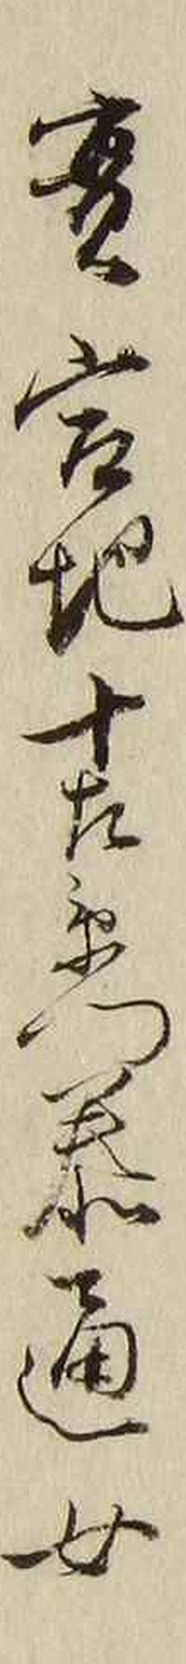妾宮地十左衛門泰通女

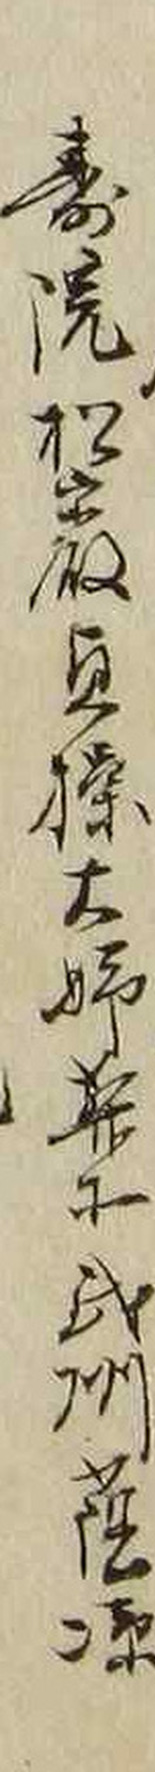寿院松宗殿貞操大姉葬所武州蔭涼
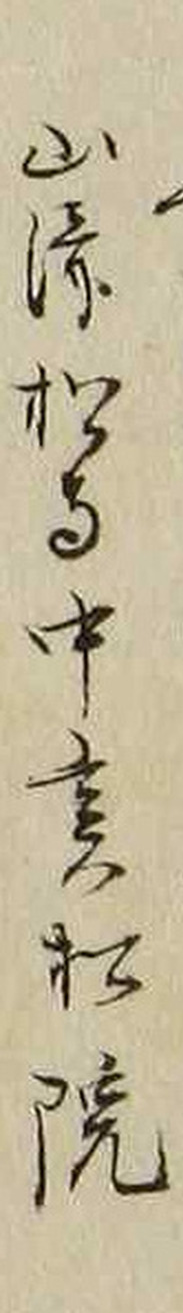山済松寺中実松院
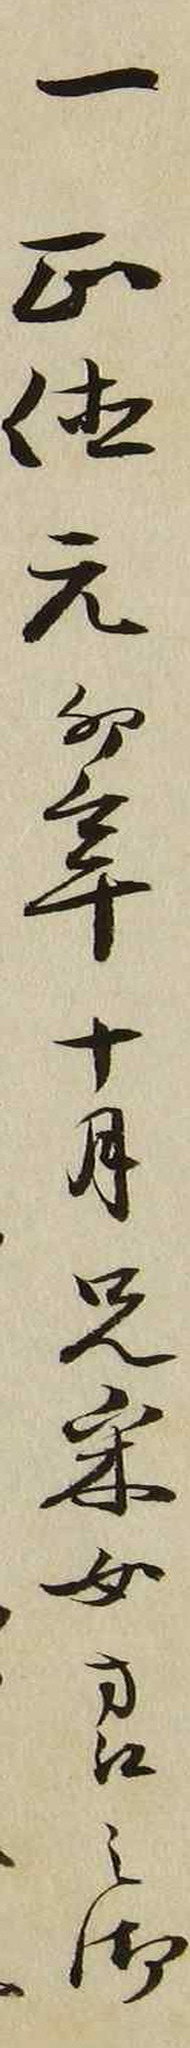一正徳元卯年十月兄采女方江之御
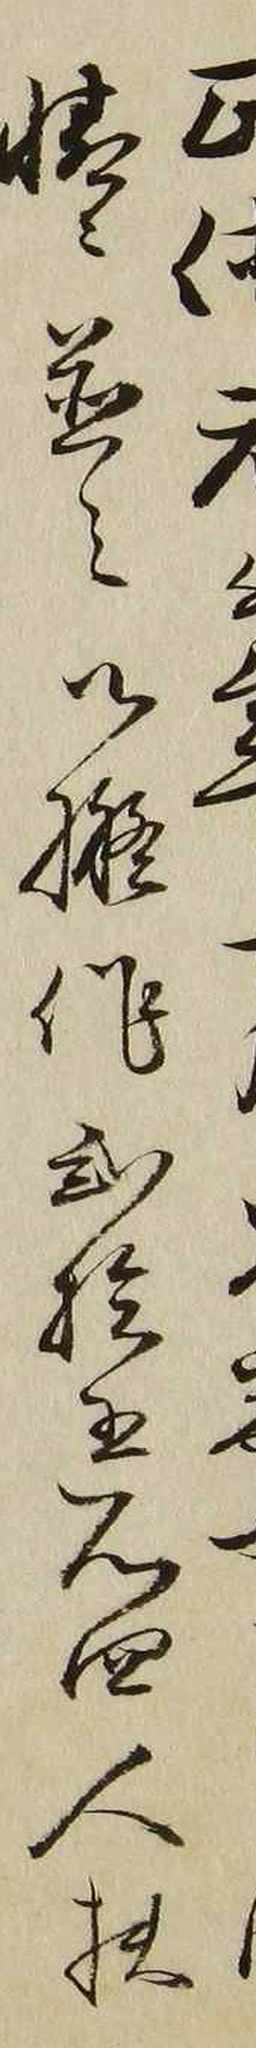情に並之御擬作弐拾五石四人扶
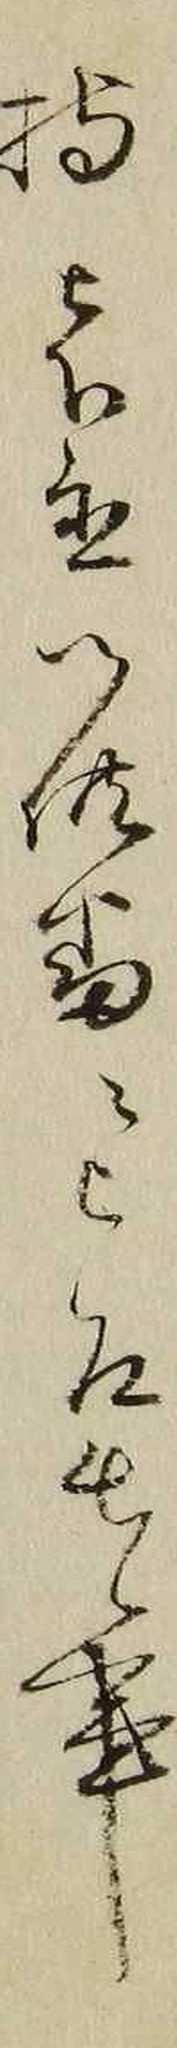持被下置御供番に被召出候事
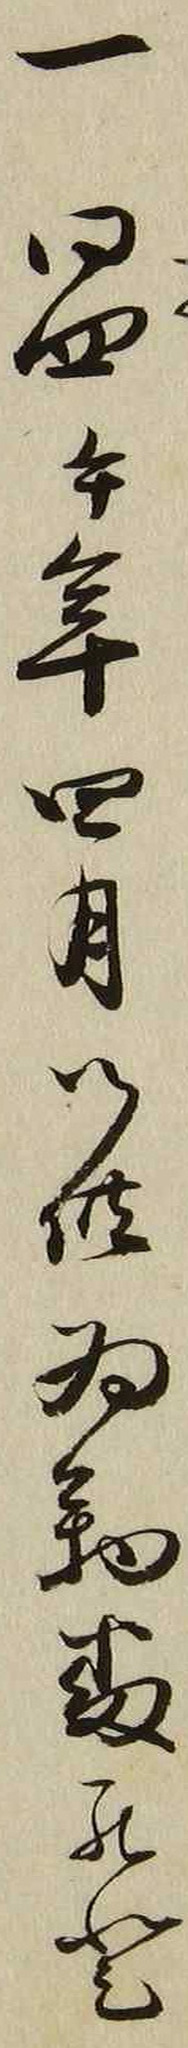一同四午年四月御供為勤番罷登
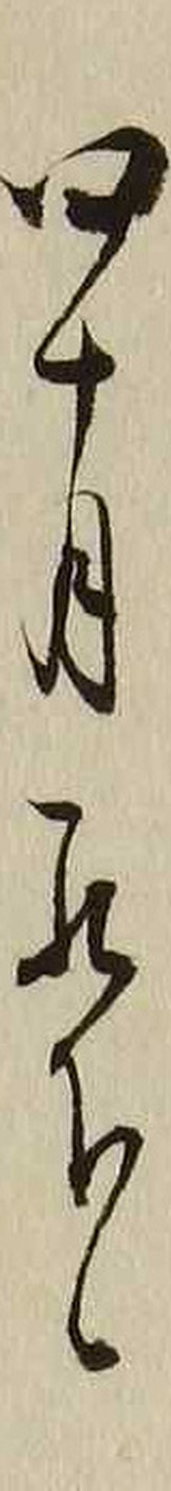同十月罷下候
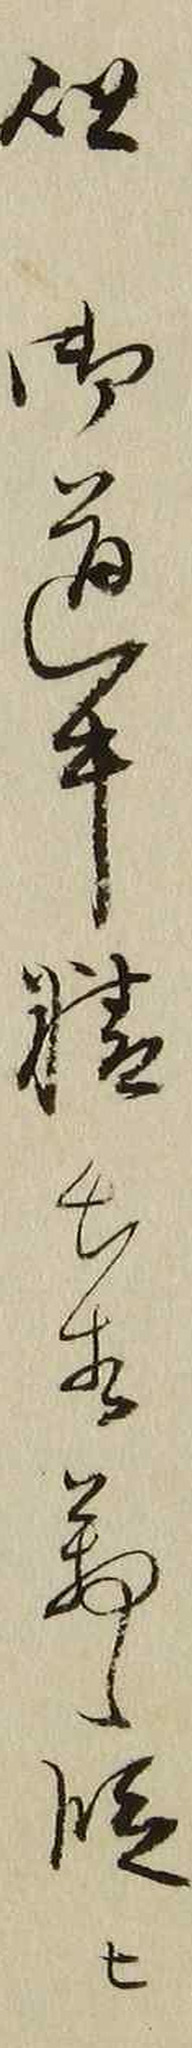但御道中精出相勤候段被
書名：諸士系譜　巻之292　き之部1
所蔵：会津若松市立会津図書館
